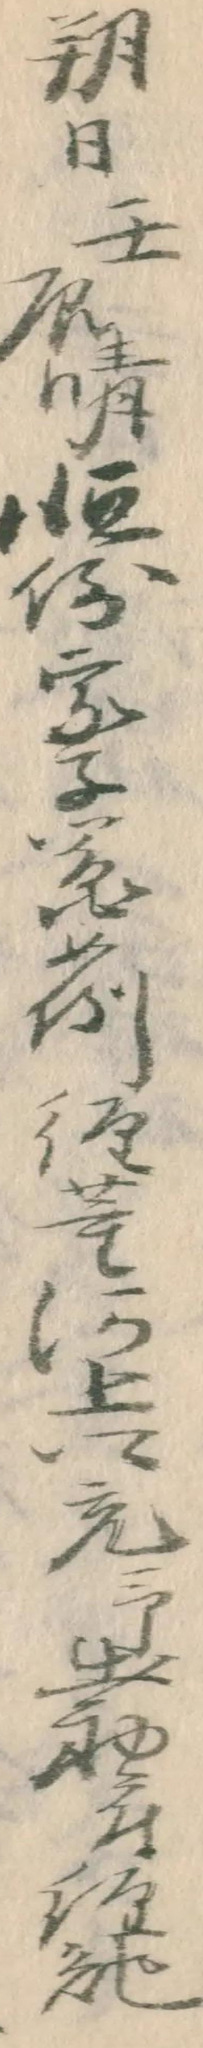朔日壬辰晴恒例家子鬮如例経薫河上郷充予出勤ニ付経紀
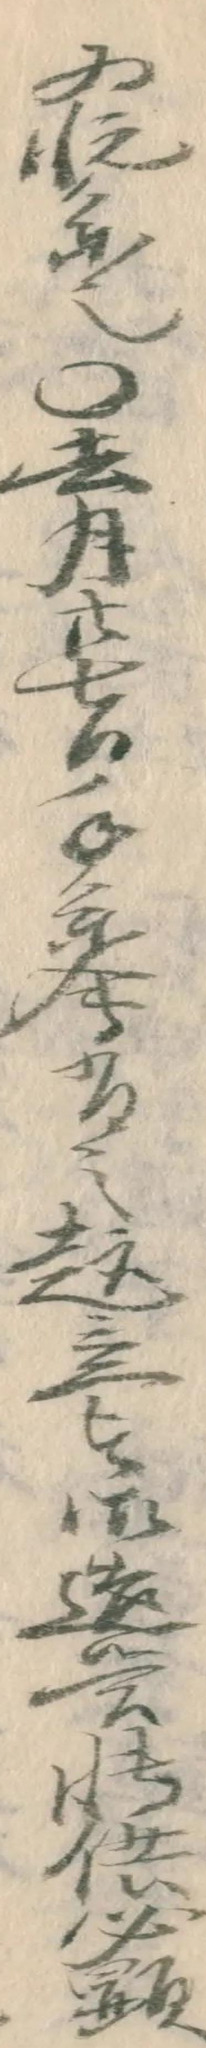為祝参之◯去月廿七日手参會有之趣意者御造営轉供必勤
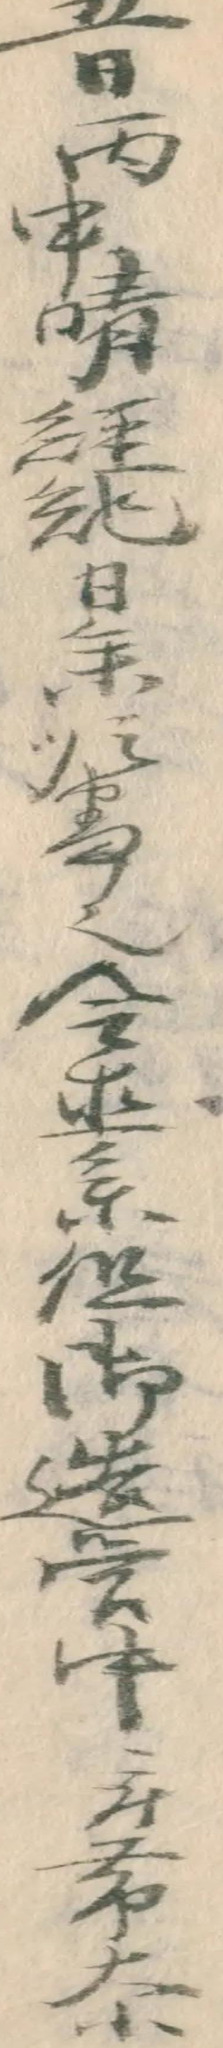五日丙申晴経紀日参順番也令直参但御造営中ニ付帯大小
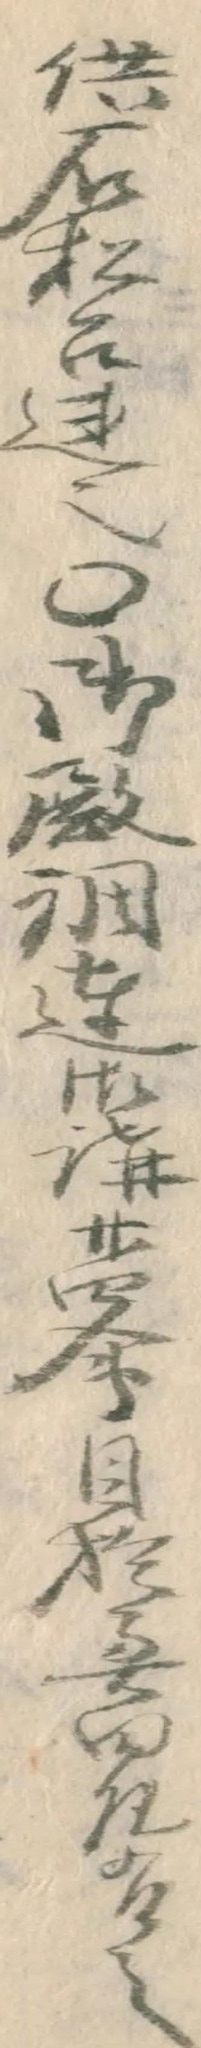供石松召連也◯御殿調達御講廿四會目於奥田屋有之
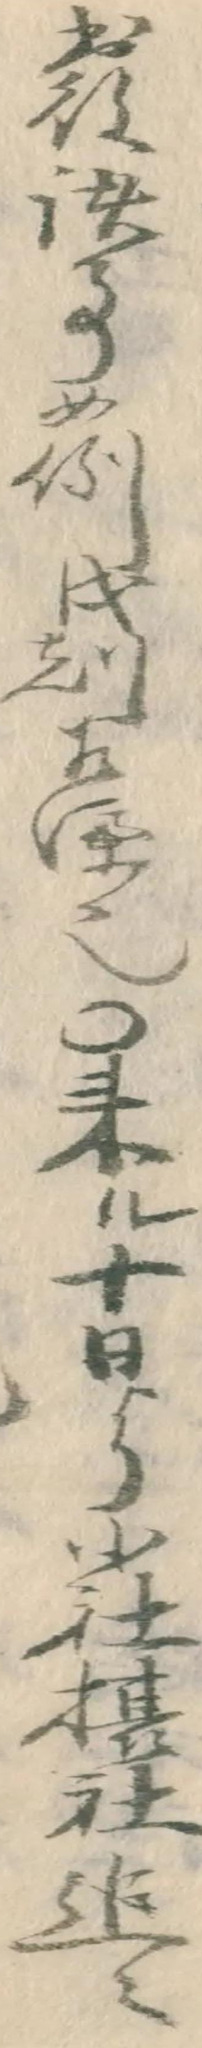出役諸事如例戌刻相済也〇来ル十日より小社摂社追〻
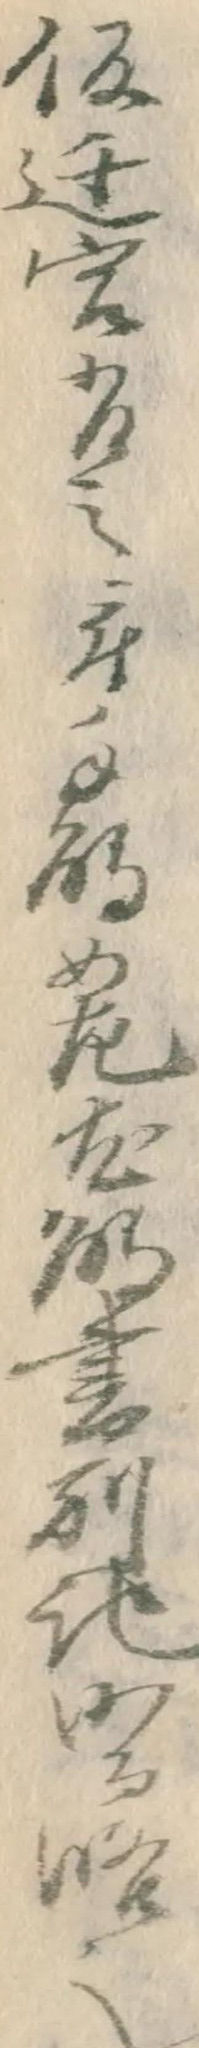仮遷宮有之ニ付手觸如左尤觸書別記仍而略之

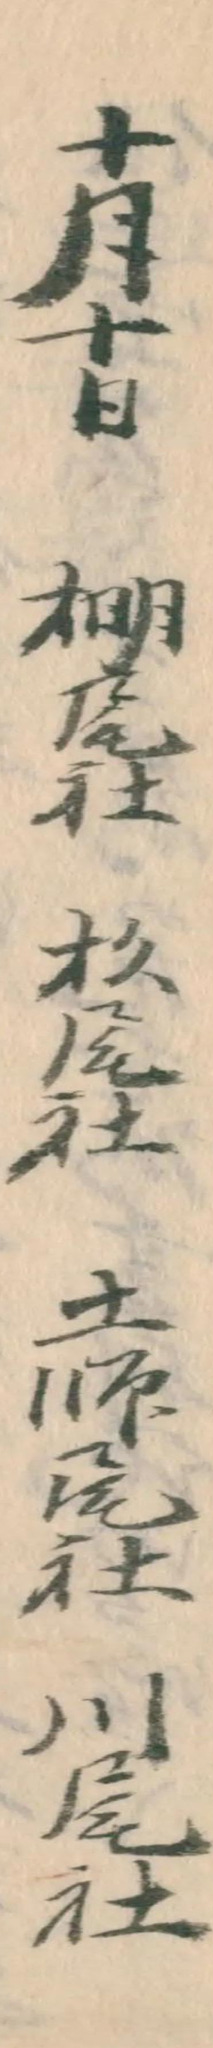十月十日棚尾社杦尾社土師尾社川尾社
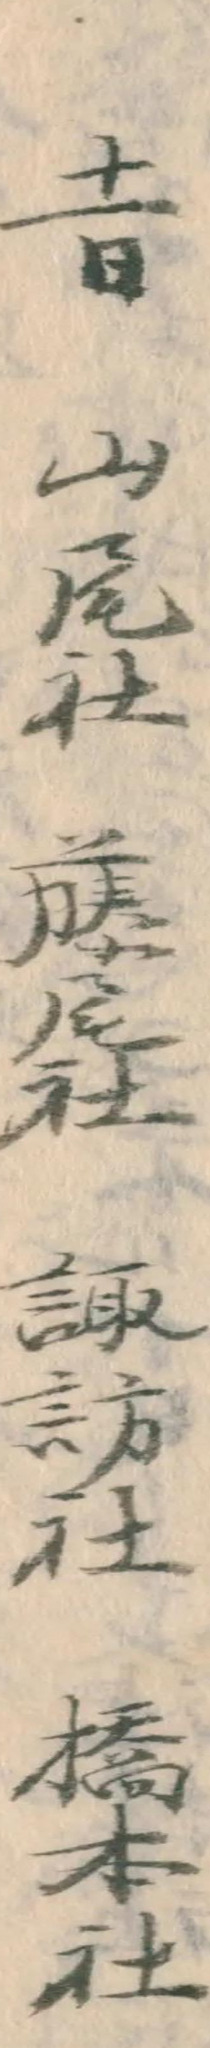十一日山尾社藤尾社諏訪社橋本社
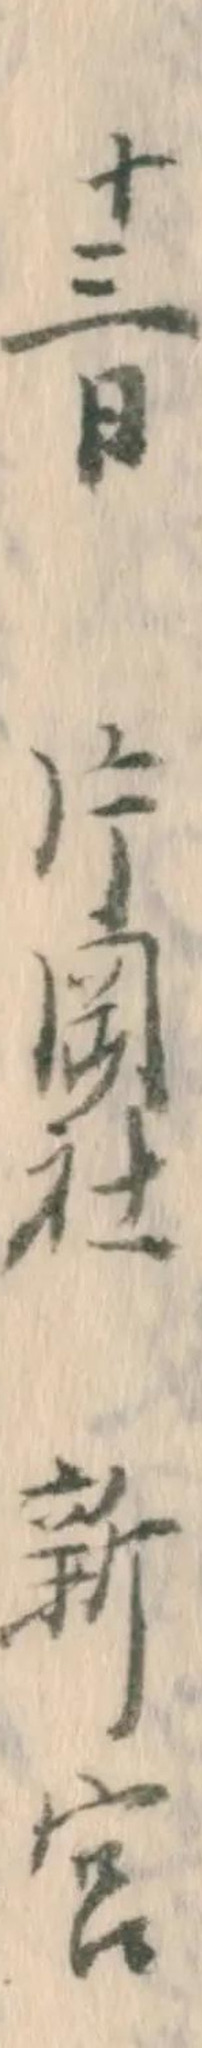十三日片岡社新宮
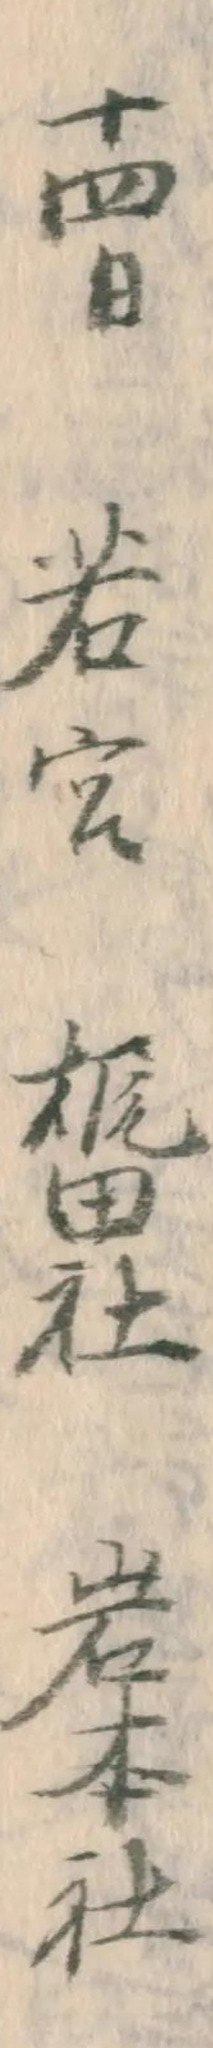十四日若宮梶田社岩本社
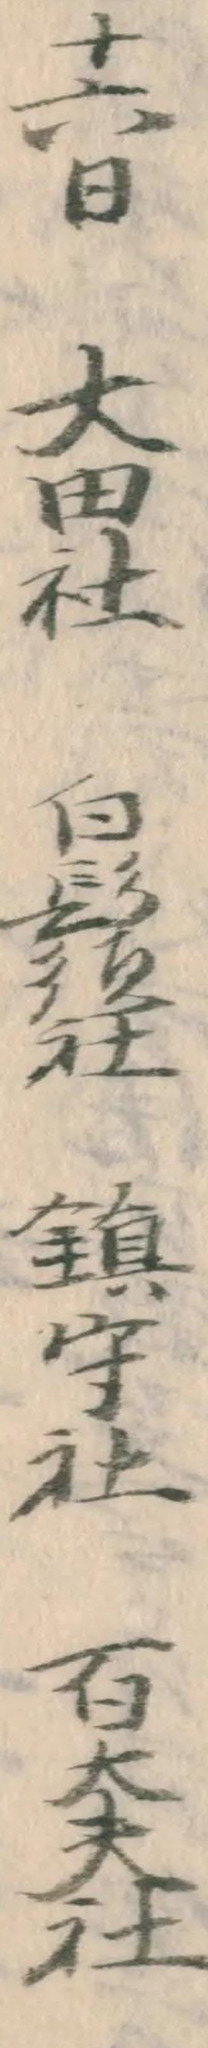十六日大田社白髭社鎮守社百大夫社
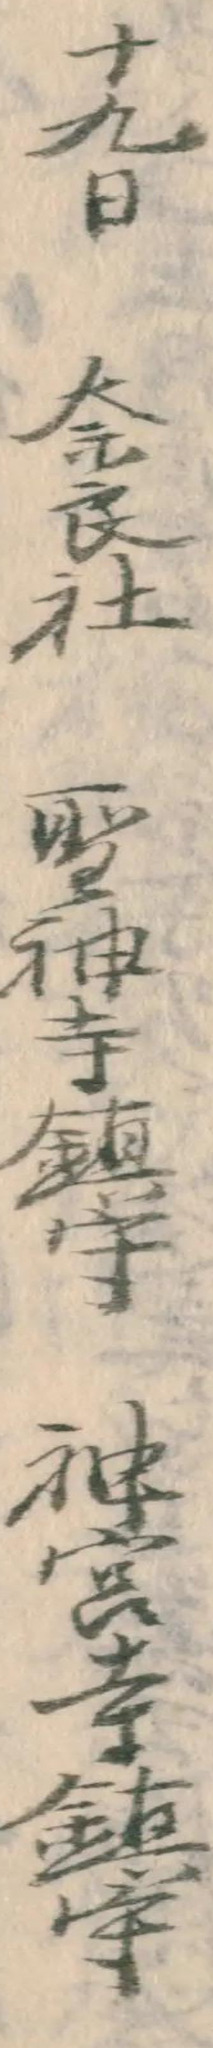十九日奈良社聖神寺鎮守神宮寺鎮寺
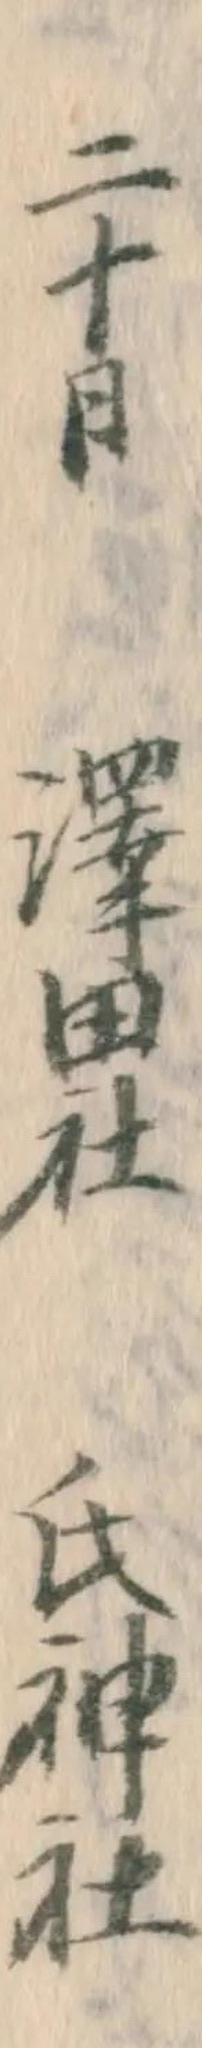二十日澤田社氏神社
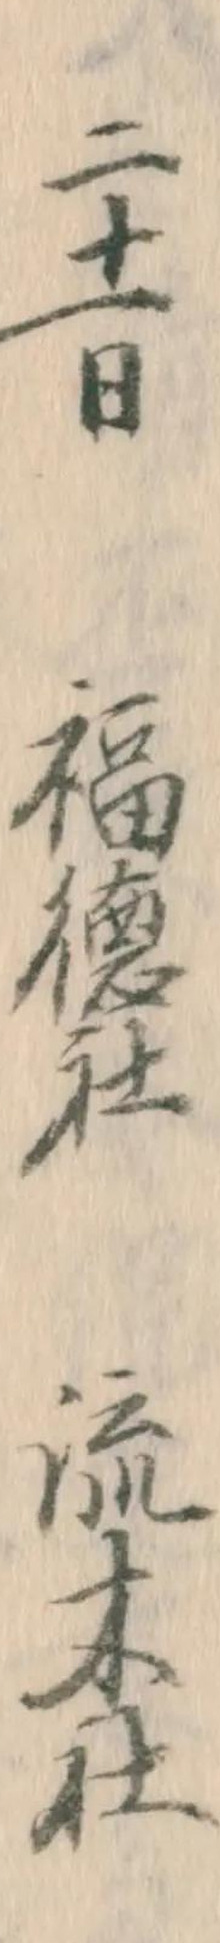二十一日福徳社流木社
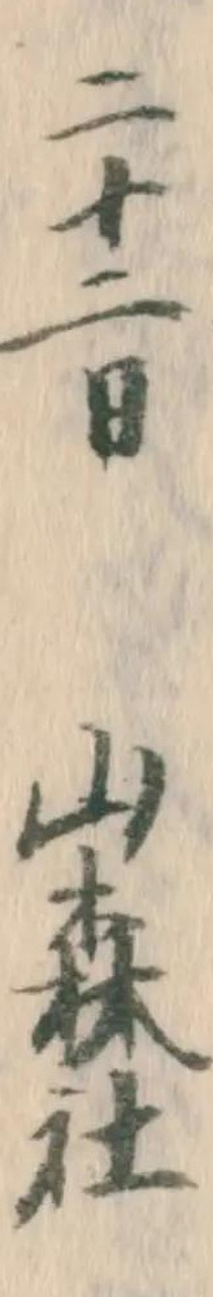二十二日山森社
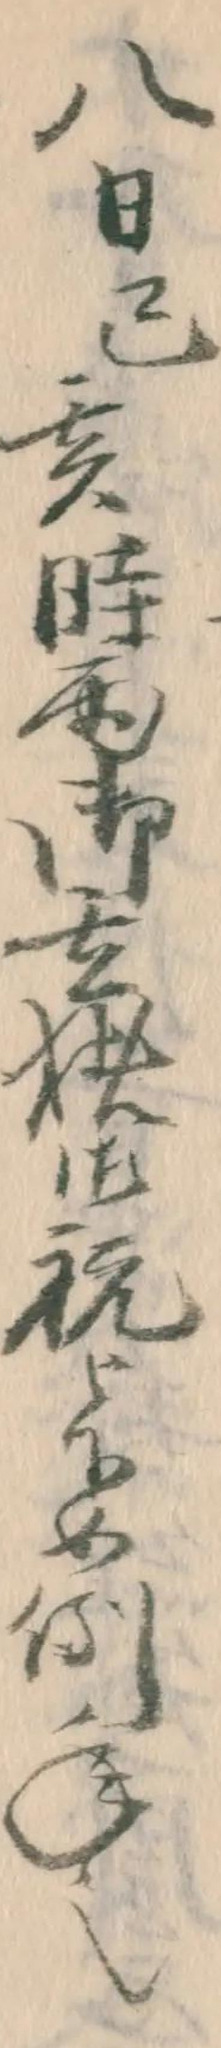八日己亥時雨御玄猪御祝被下如例年也
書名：賀茂社記録. 第66冊
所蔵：国立国会図書館 National Diet Library, JAPAN
